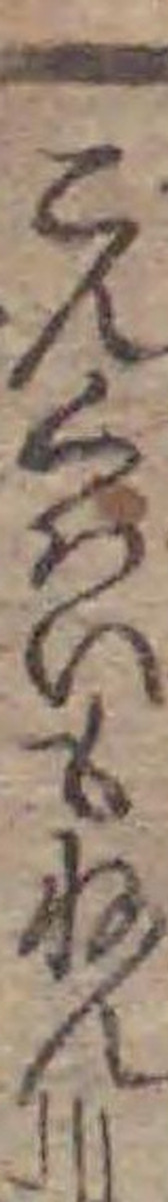こんくはいもねん
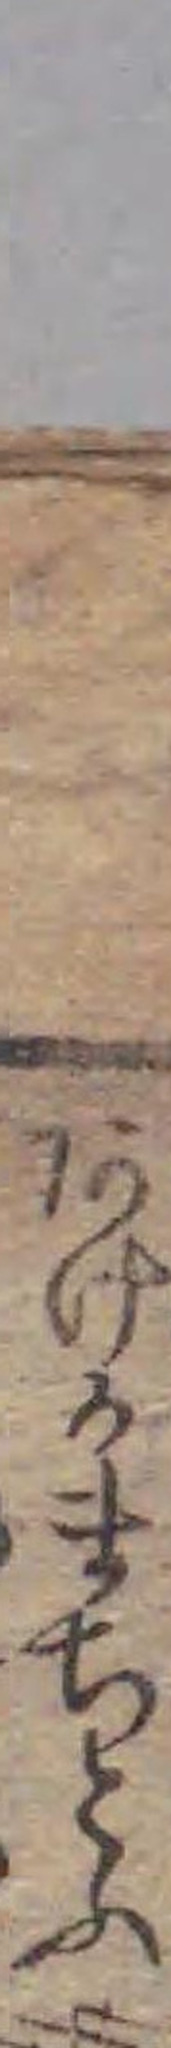あけかまちとふ
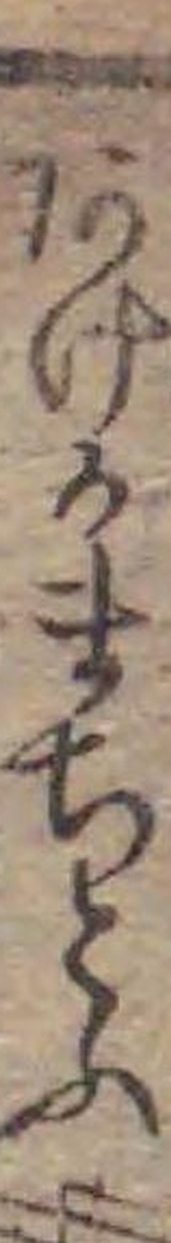あけかまちとふ
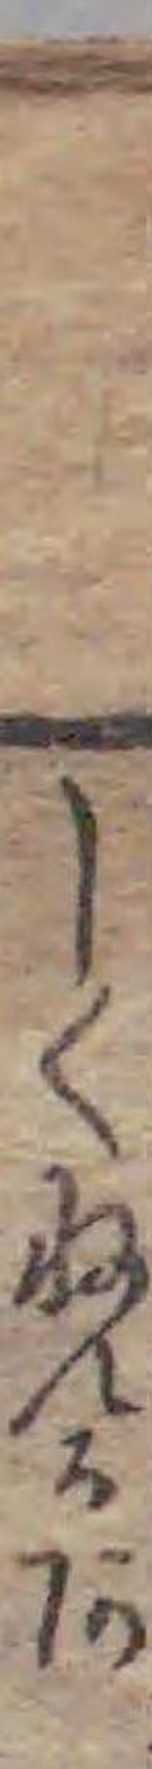しくねんかあ
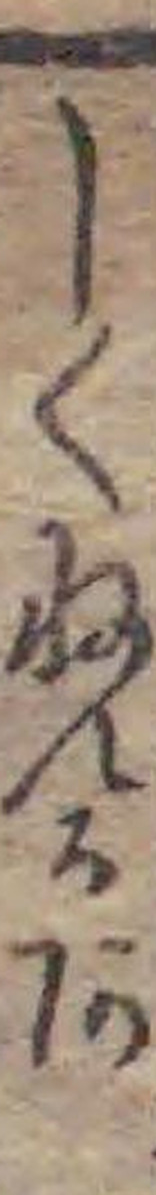しくねんかあ
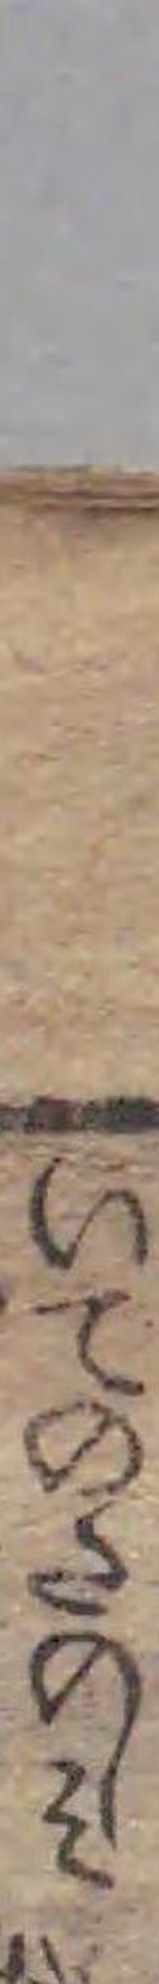いてのたのしみ
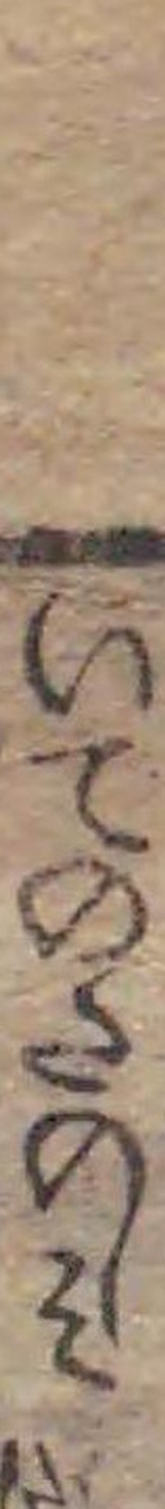いてのたのしみ
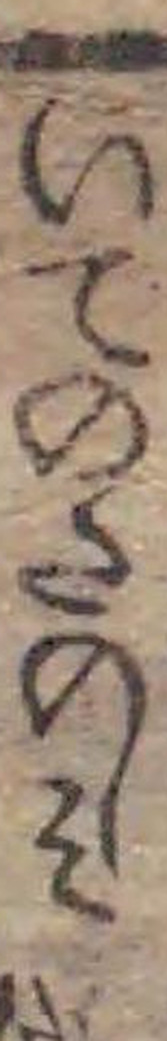いてのたのしみ
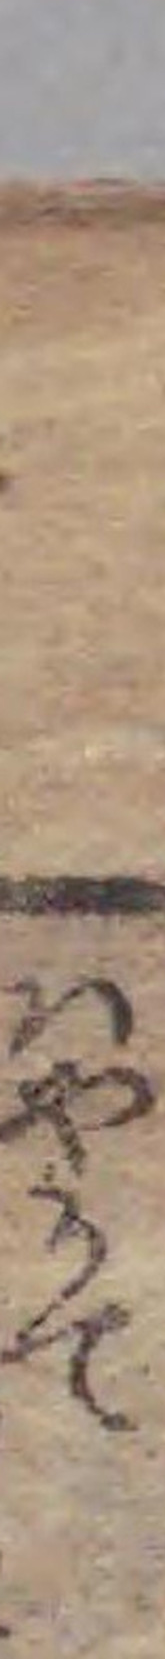はやかて
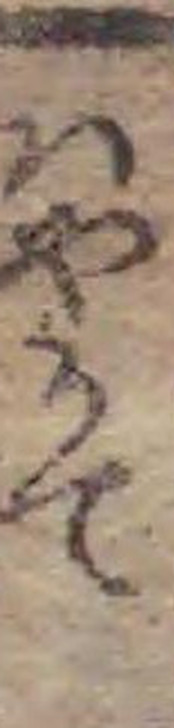はやかて
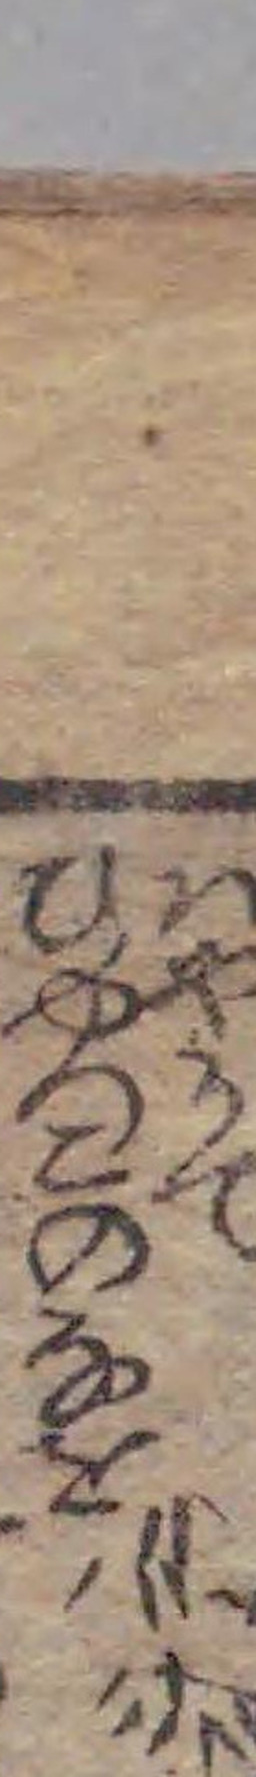ひやつこのなを
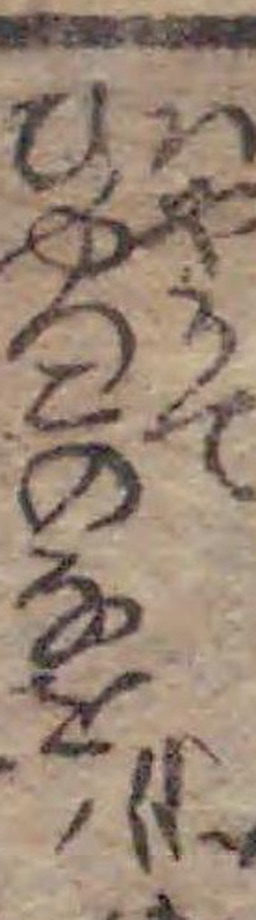ひやつこのなを
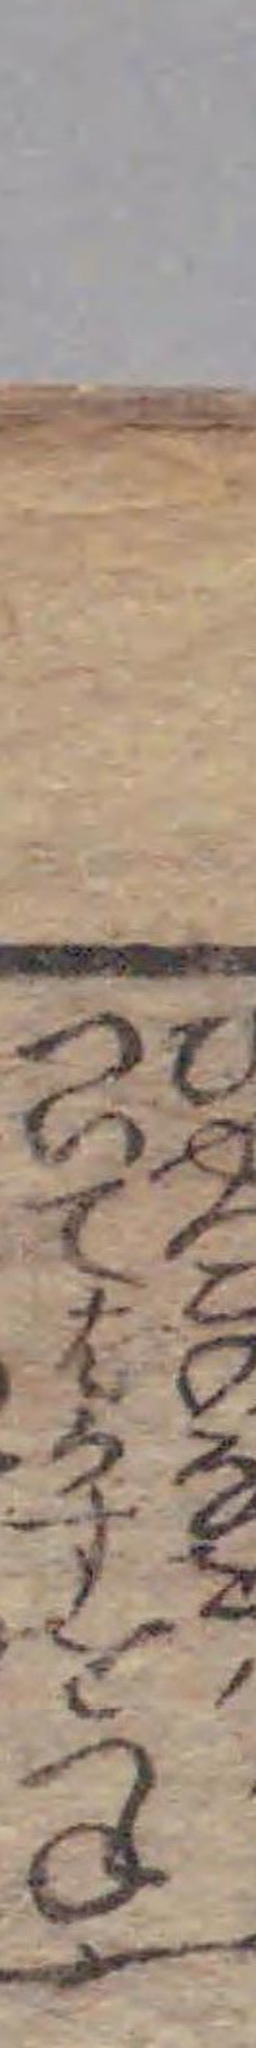ついてはかすをつね
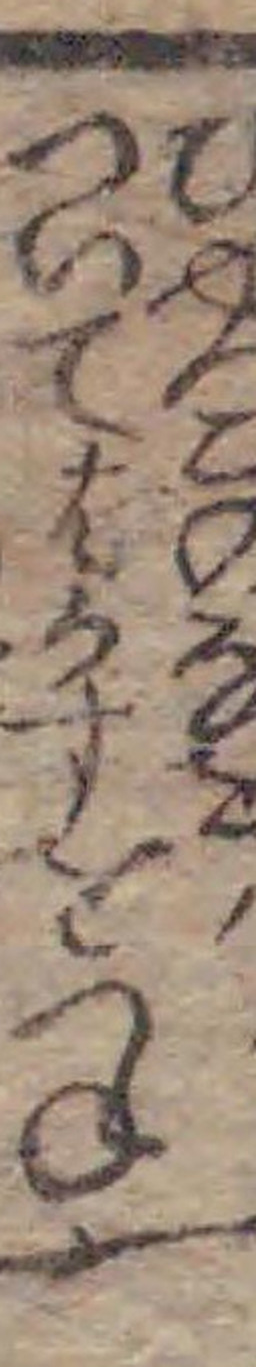ついてはかすをつね
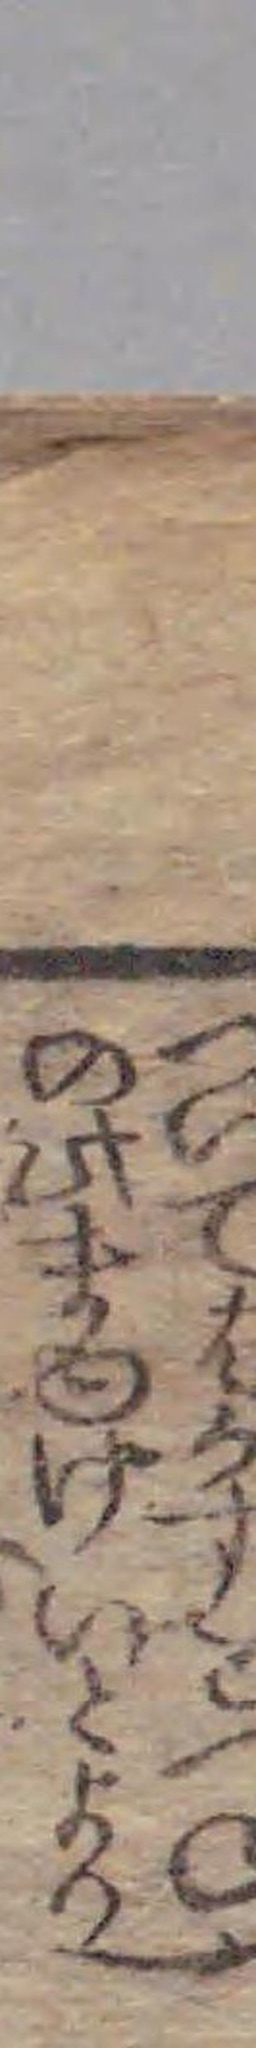の此まゆけいとより
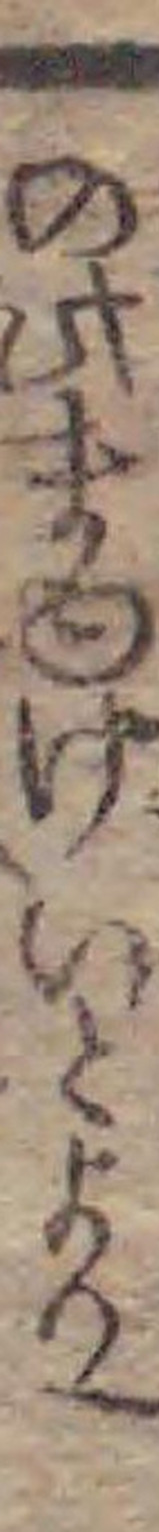の此まゆけいとより
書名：化物楽屋異牒 : 2巻
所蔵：国立国会図書館 National Diet Library, JAPAN
